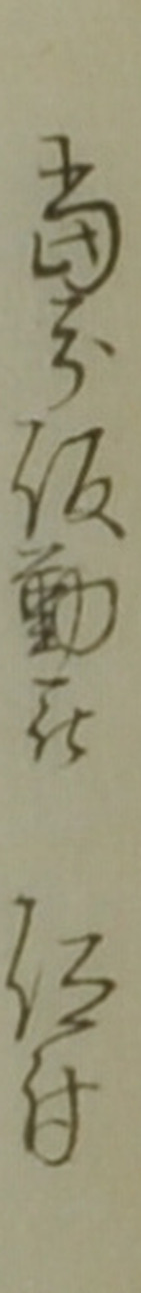当分仮勤被仰付
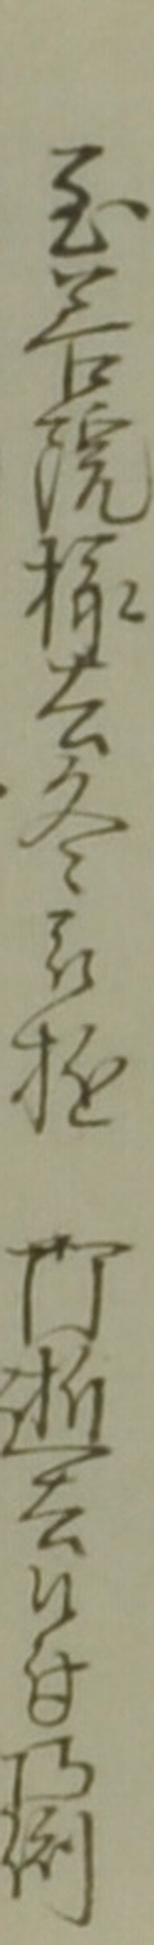至善院様去冬被遊御逝去候付御側
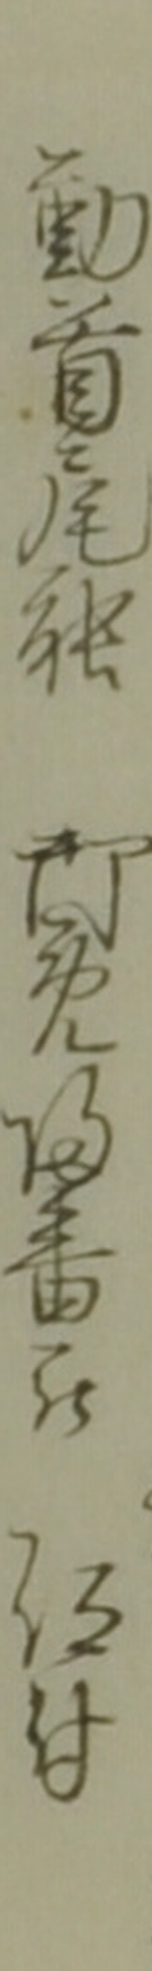勤首尾能御免帰番被仰付
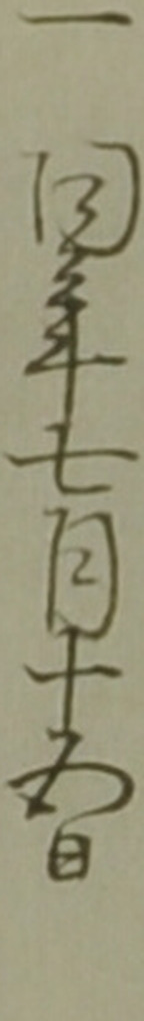一同年七月十五日
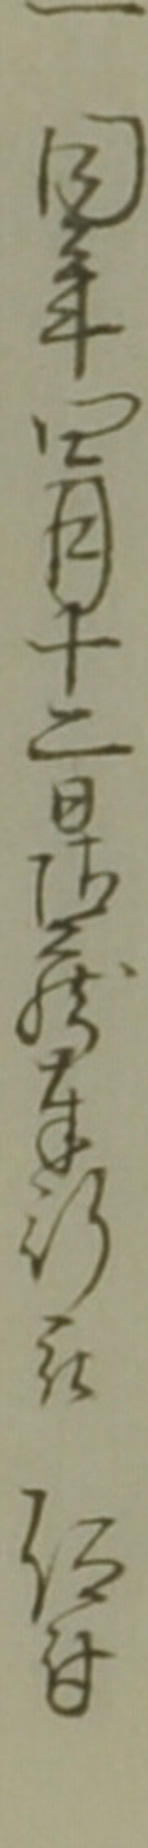一同年四月十二日御蔵奉行被仰付
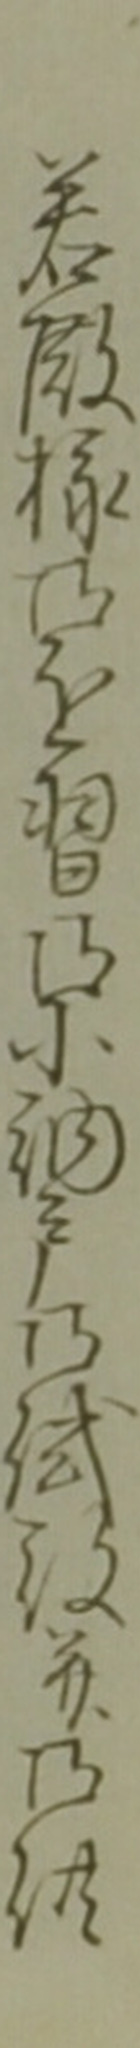若殿様御近習御小納戸御試役并御供
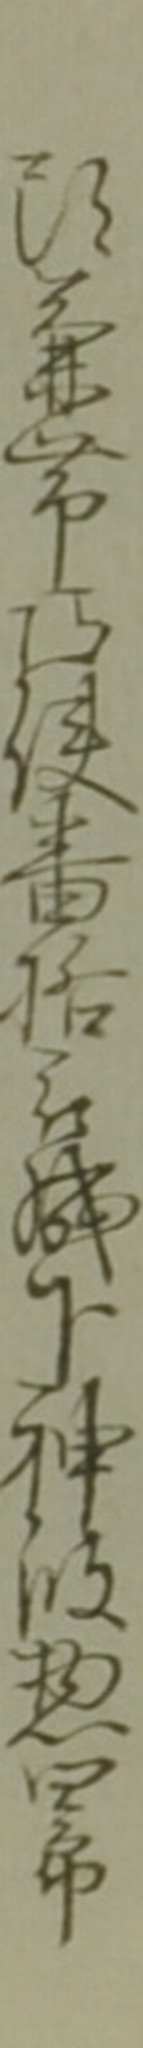頭兼帯御使番格被成下神波惣四郎
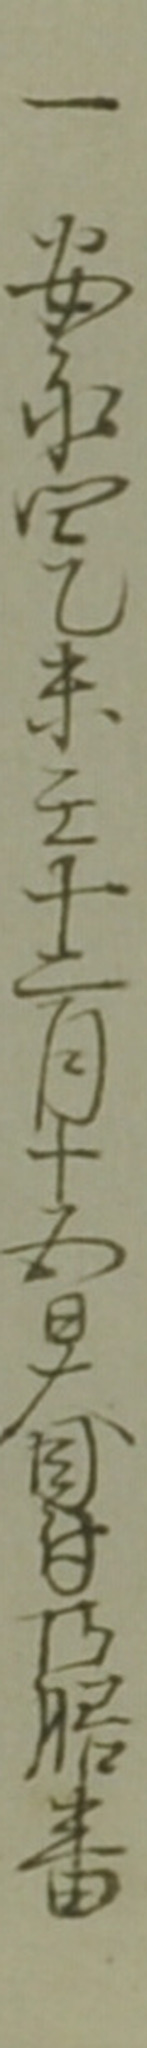一安永四乙未閏十二月十五日大目付御膳番
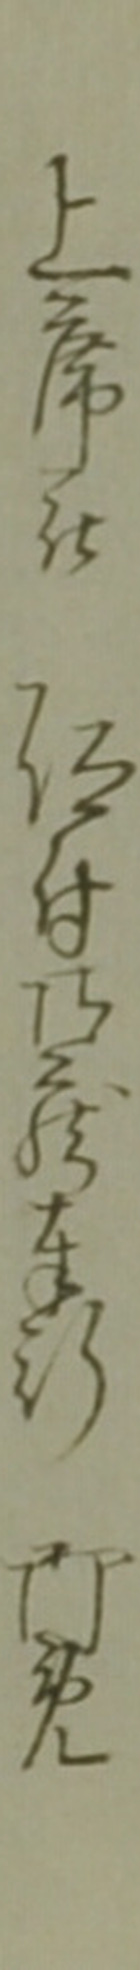上席被仰付御蔵奉行御免
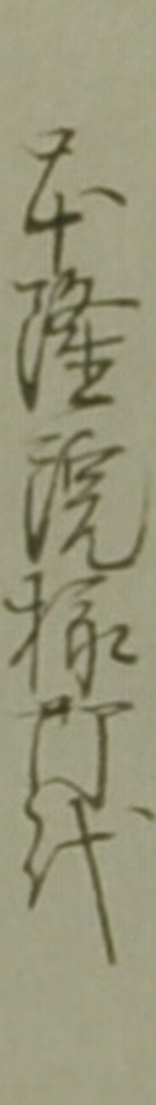本隆院様御代
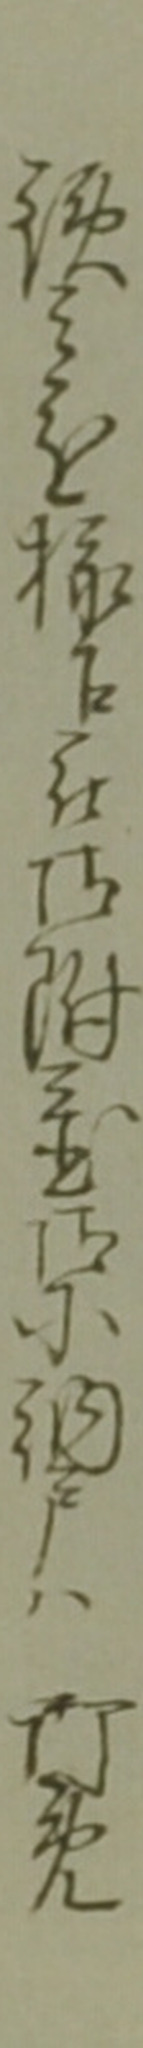鉄之進様江被御附置御小納戸ハ御免
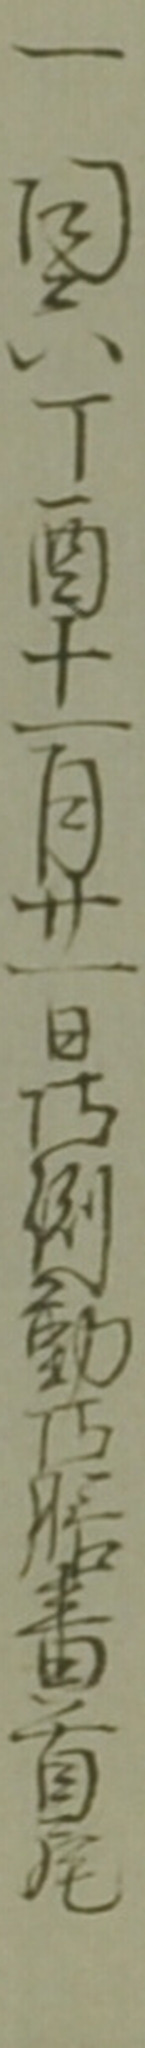一同六丁酉十一月廿一日御側勤御膳番首尾
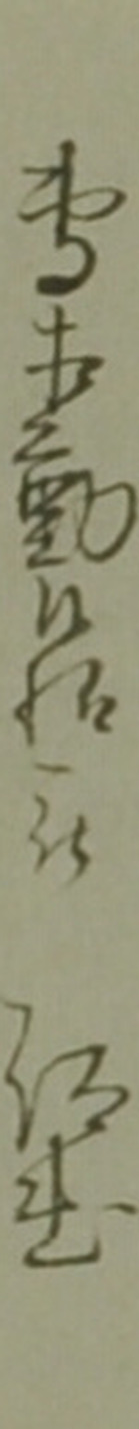専相勤候様被仰出
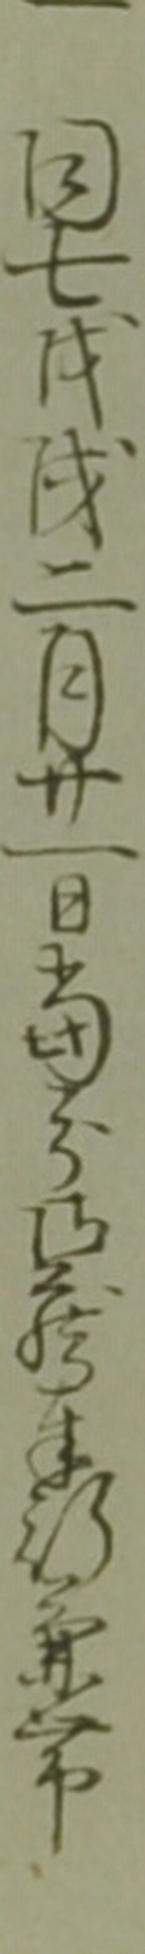一同七戊戌二月廿一日当分御蔵奉行兼帯
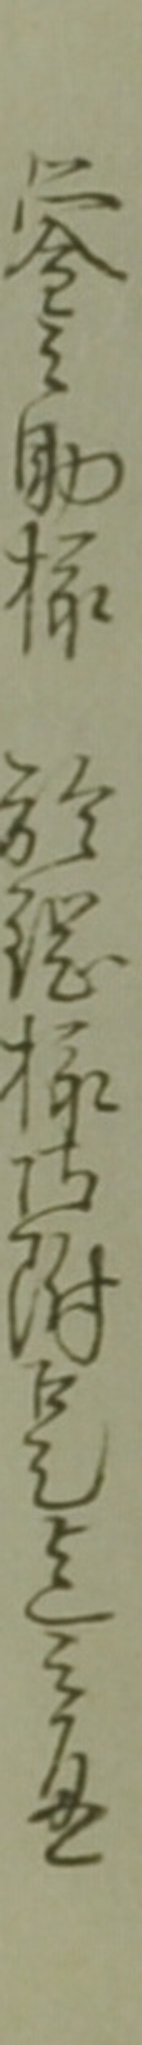鎣之助様於綱様御附是迄之通
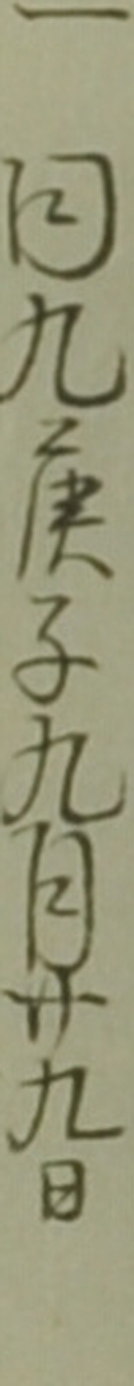一同九庚子九月廿九日
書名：給人諸士勤仕録（三）
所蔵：伊那市立高遠町図書館・合同会社AMANE
